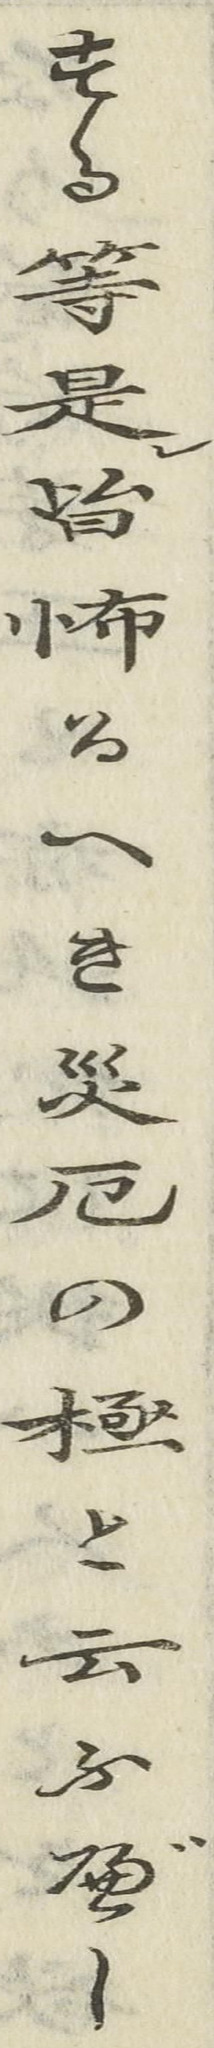する等是皆怖るへき災厄の極と云ふべし
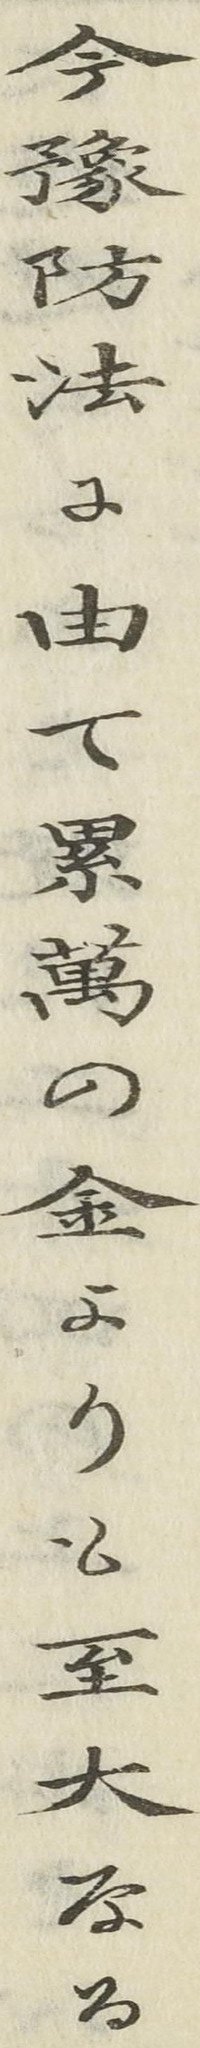予防法に由て累萬の金よりも至大なる
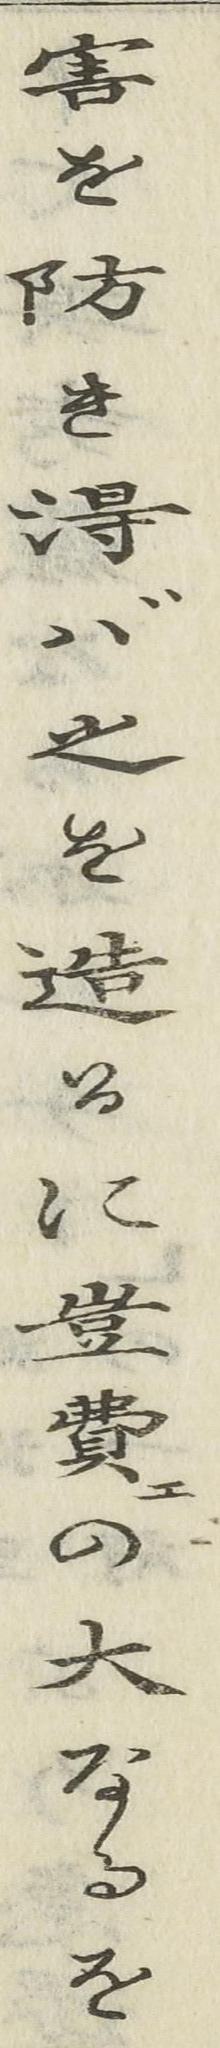害を防き得ば之を造るに豈費大なるを
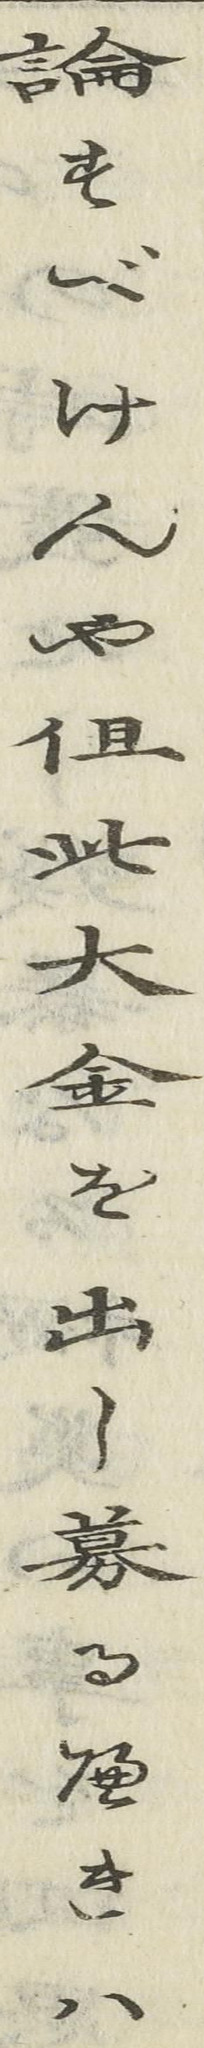論すべけんや但此大金を出し募るへきは
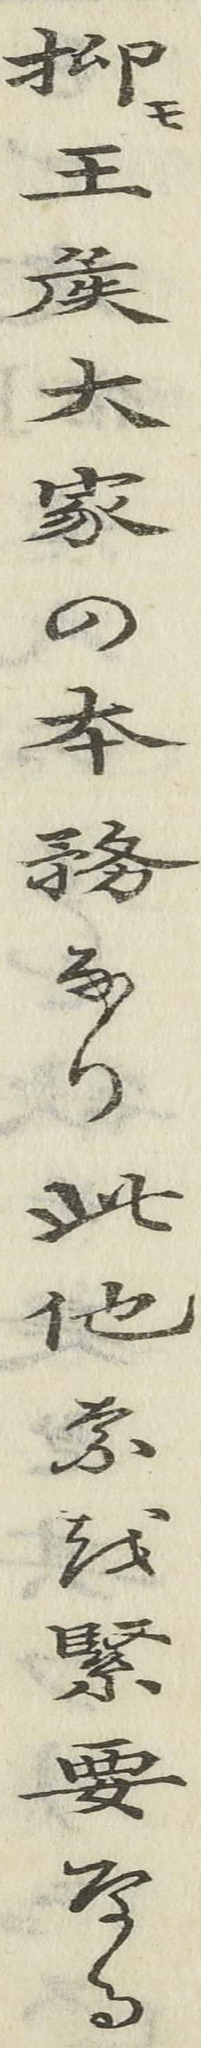抑王侯大家の本務なり此他なを緊要なる
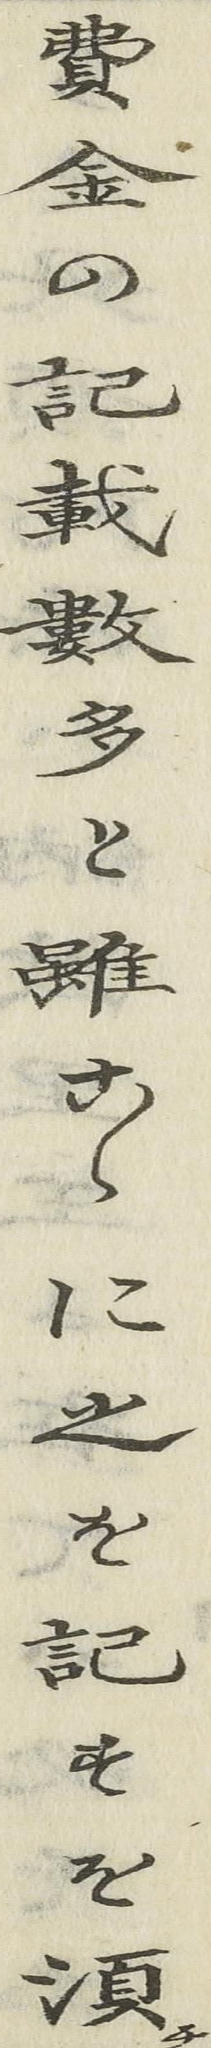費金の記載数多と雖こゝに之を記すを須
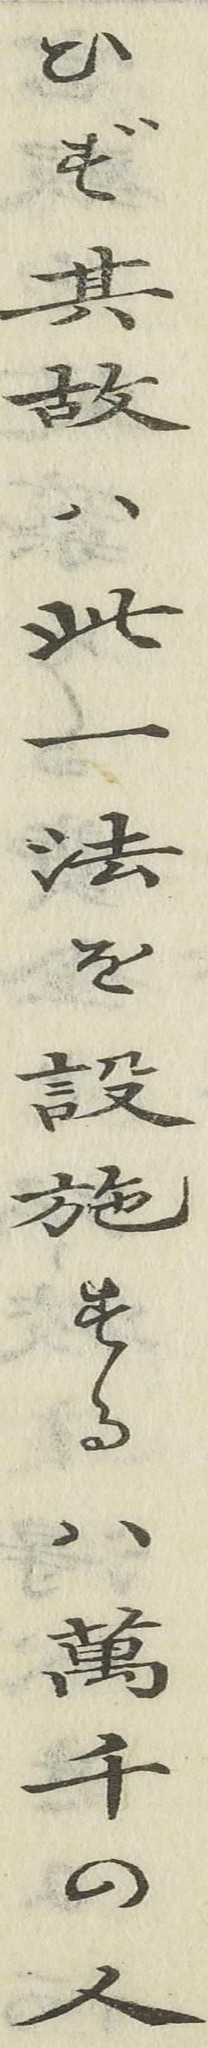ひず其故は此一法を設施するは萬千の人
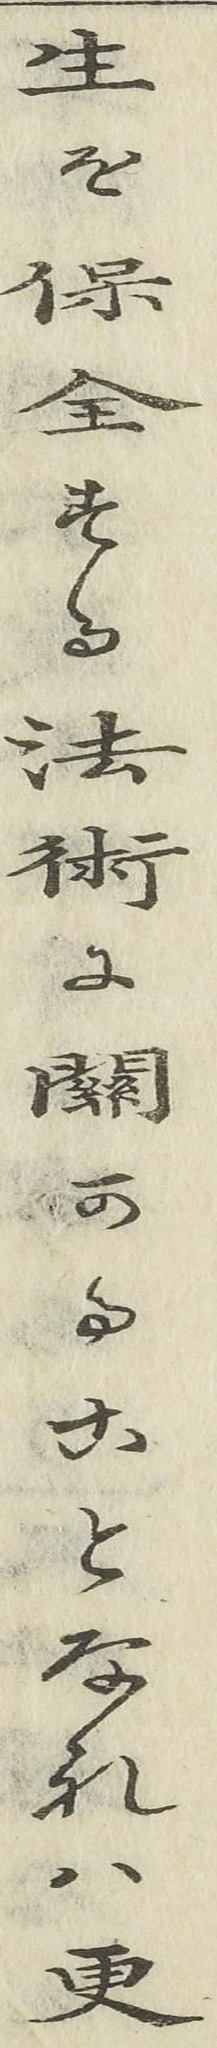生を保全する法術に関かたことなれは更
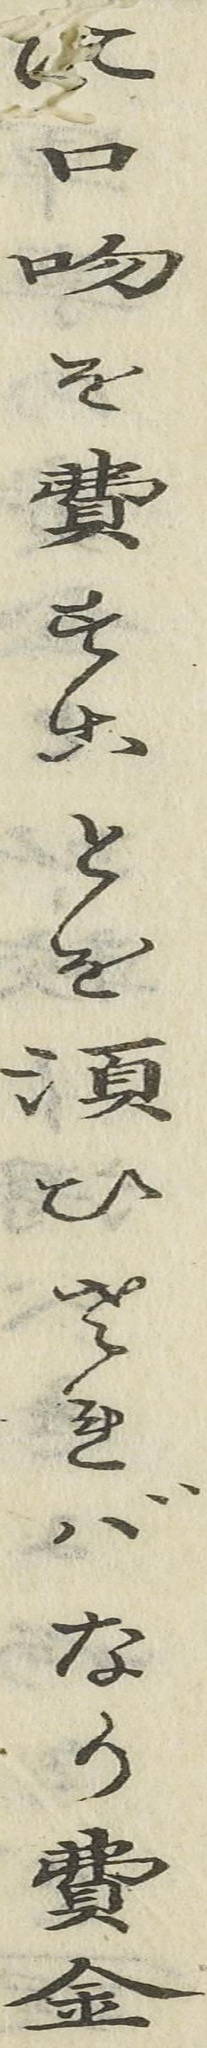に口吻を費すことを須ひさればなり費金

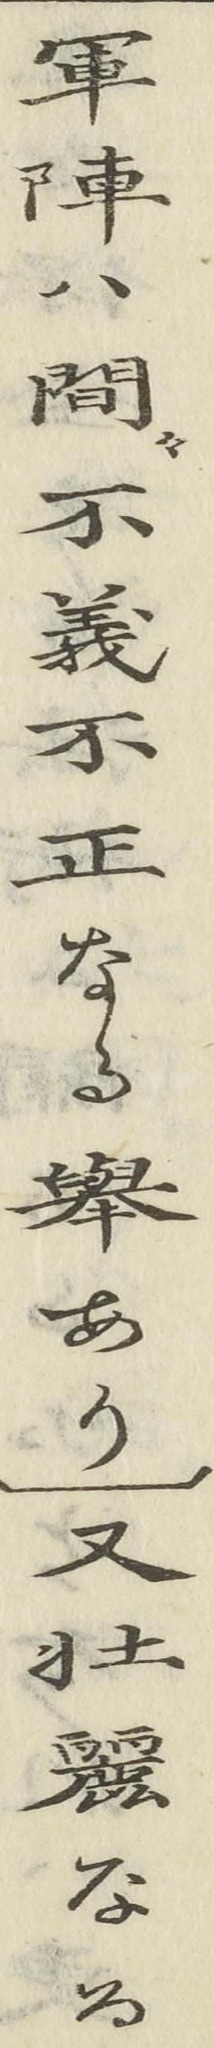軍陣は間々不宜不正なる挙あり〕又壮麗なる
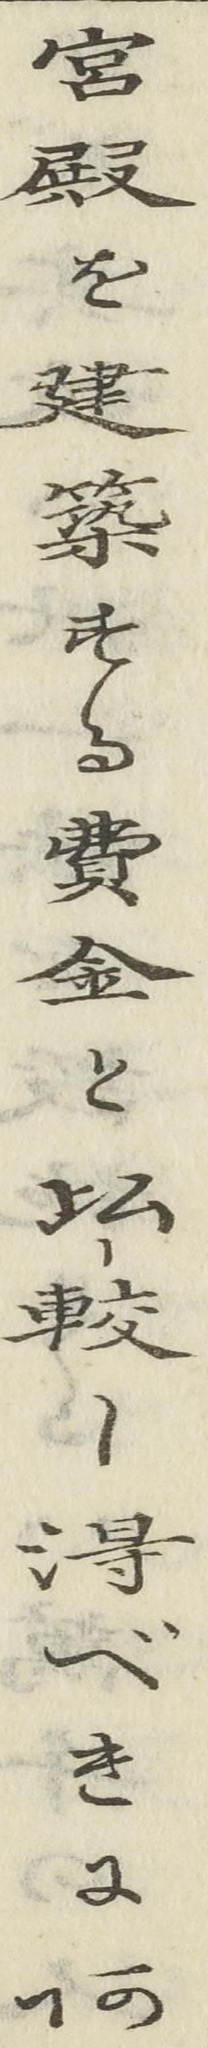宮殿を建築する費金と比較し得べきにあ
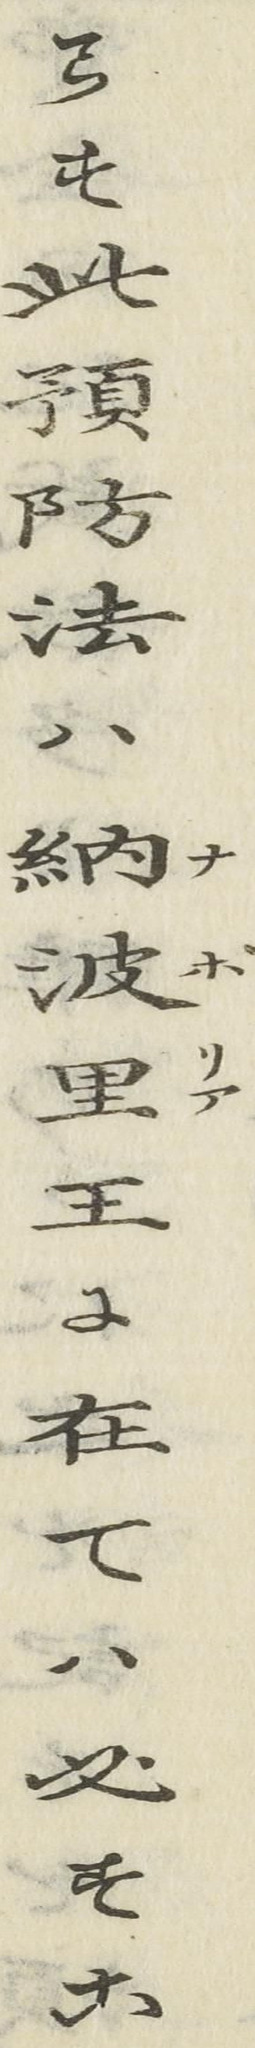らす此予防法は納波里王に在ては必すこ
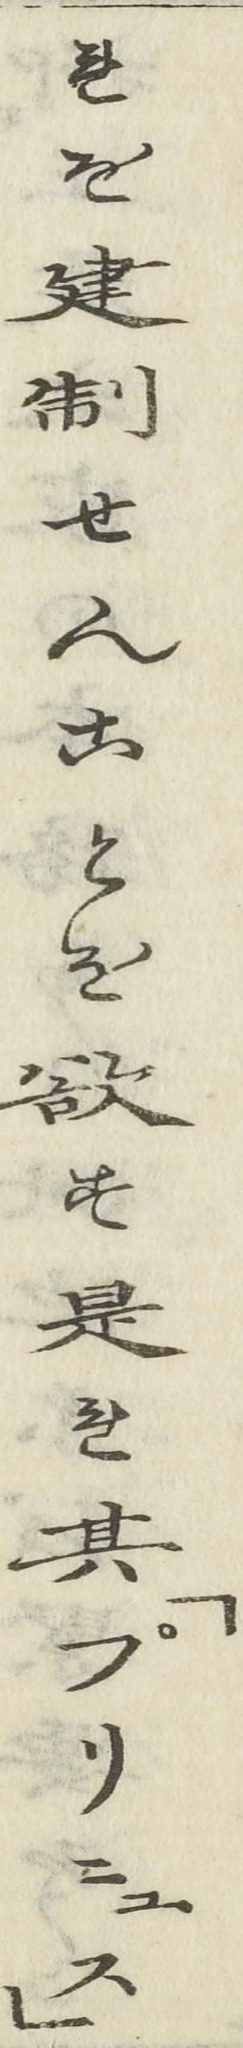れを建制せんことを欲す是れ其「プリニュス」
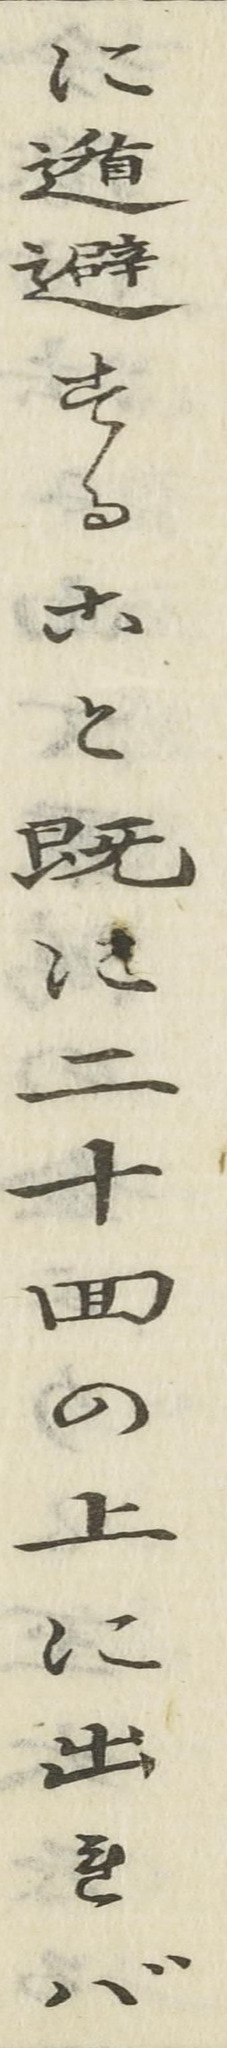に遁避すること既に二十回の上に出れば
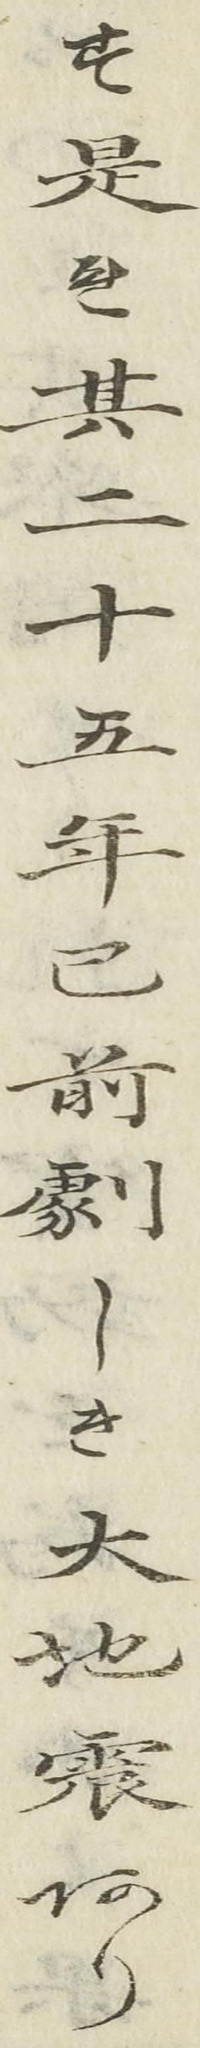す是れ其二十五年已前劇しき大地震あり
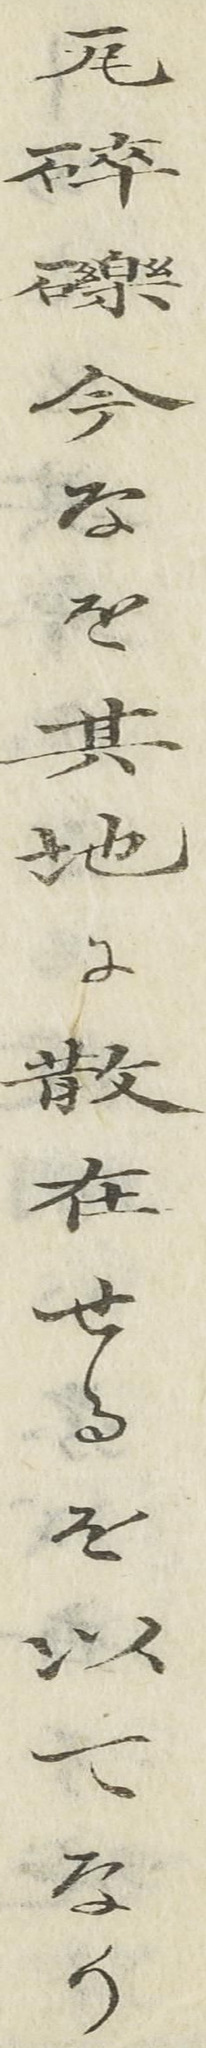瓦砕礫今なを其地に散在せるを以てなり
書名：地震預防説
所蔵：東京大学地震研究所図書室 Earthquake Research Institute Library, The University of Tokyo, JAPAN
